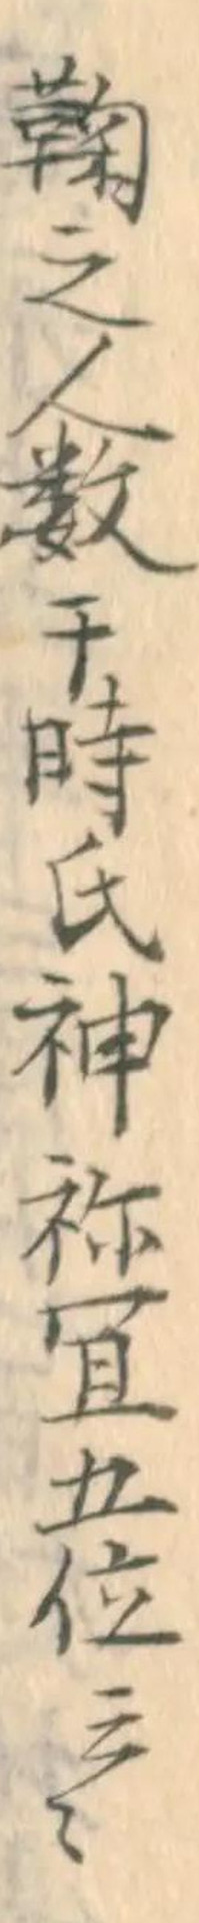鞠之人数于時氏神祢宜五位云々
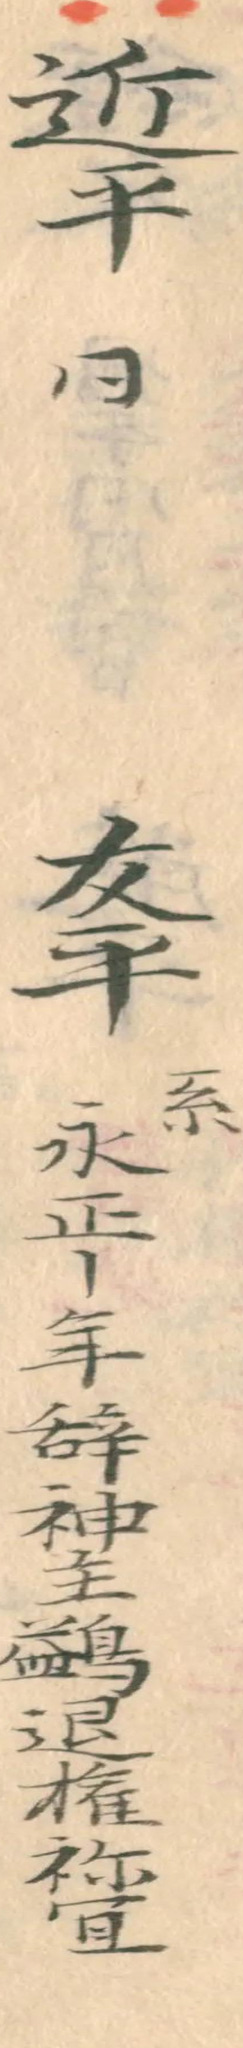∴近平同友平永正―年辞神主鷁退権祢宜
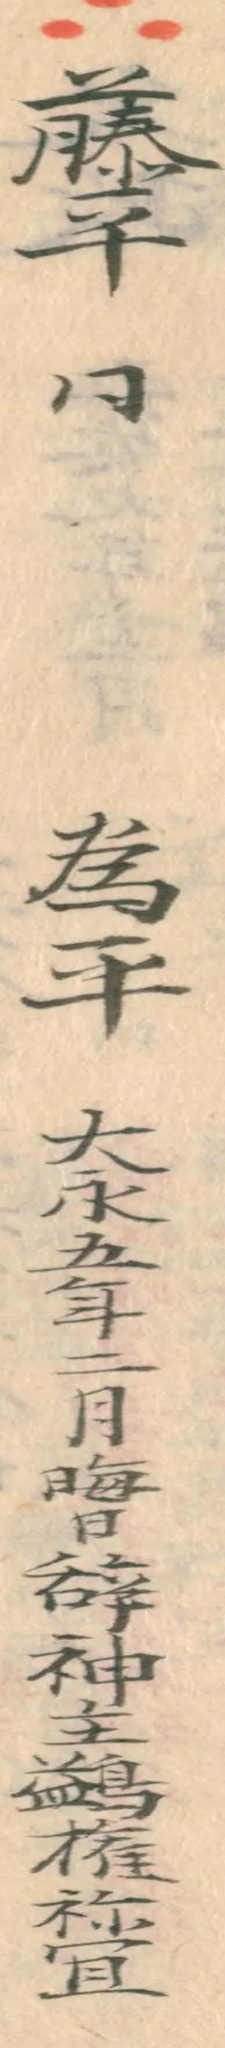∴藤平同為平大永五年二月晦日辞神主鷁権祢宜
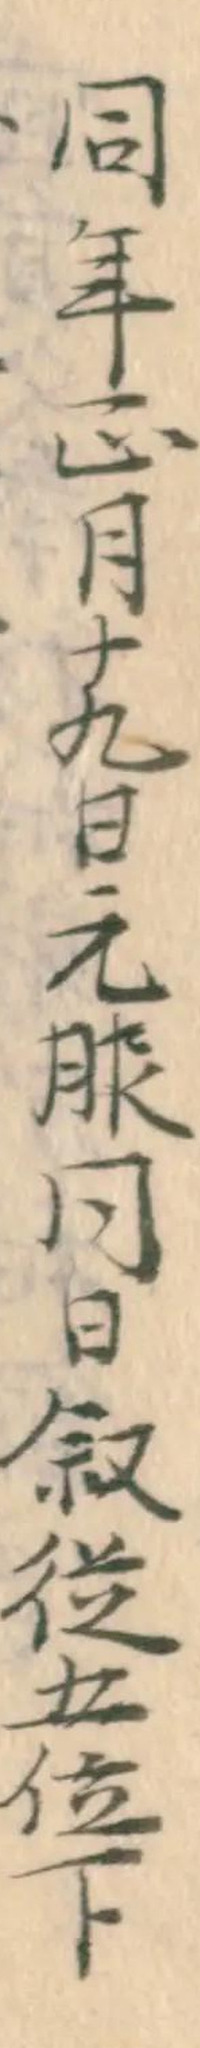同年正月十九日元服同日叙従五位下
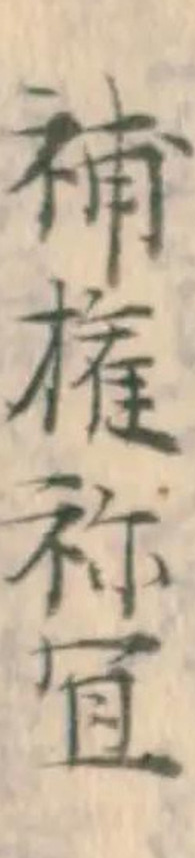補権祢宜
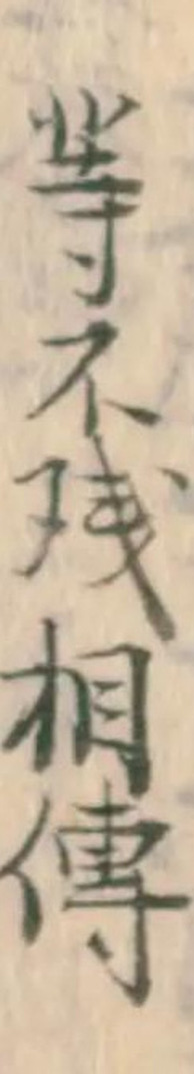等不残相伝
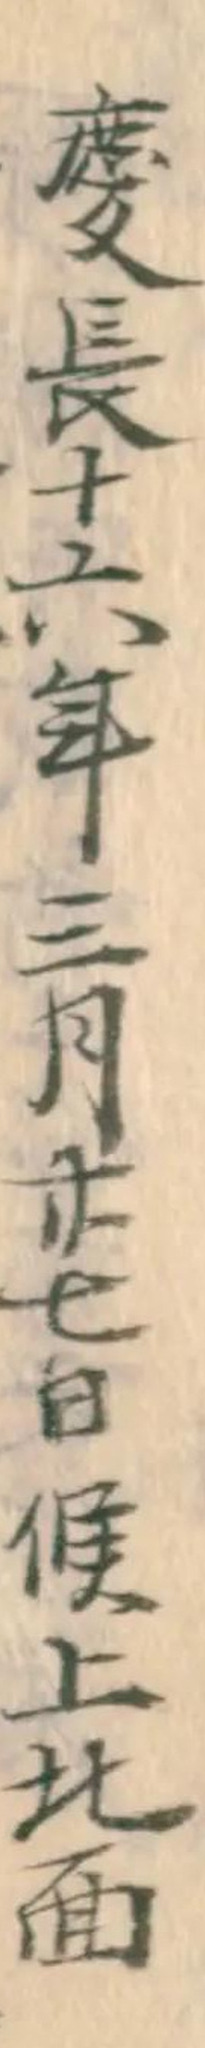慶長十六年三月廿七日候上北面
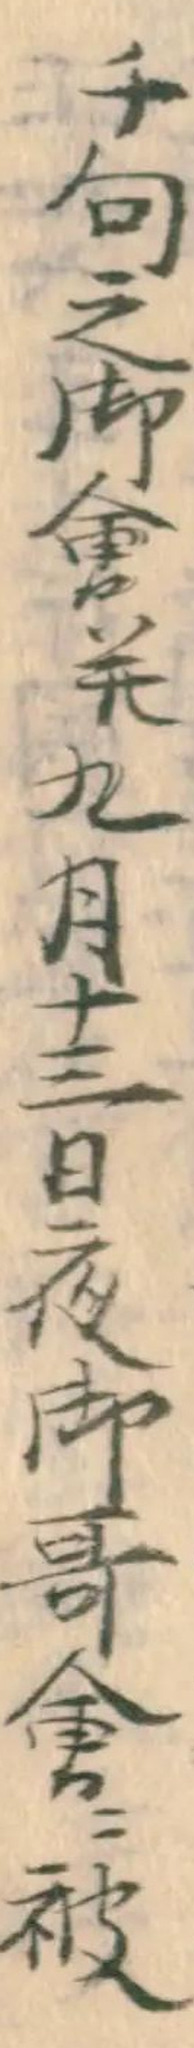八月千句之御会并九月十三日夜御歌会ニ被
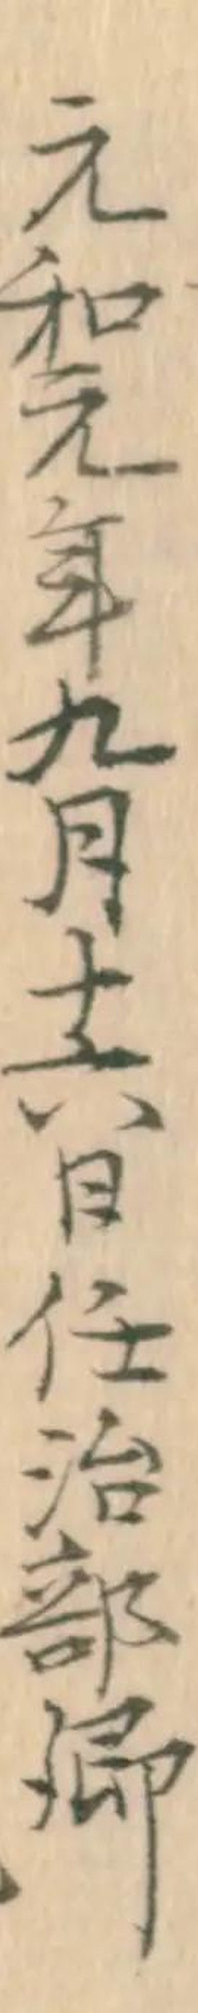七月元和元年九月十六日任治部卿
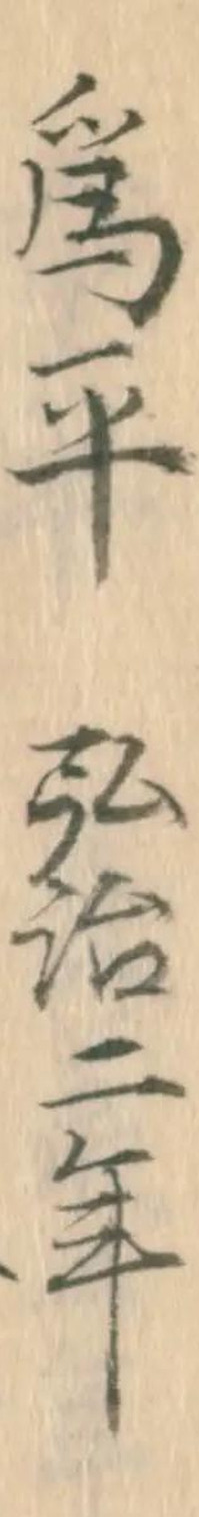為平弘治二年
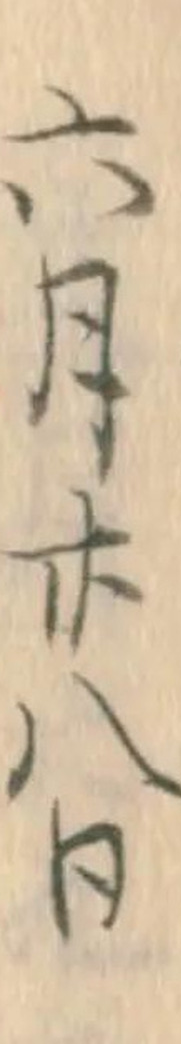六月廿八日
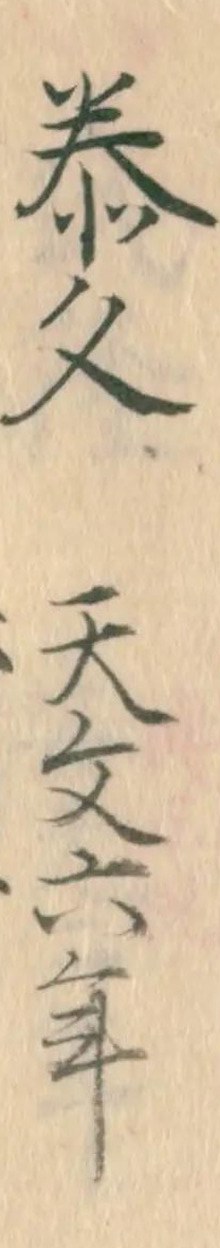泰久天文六年
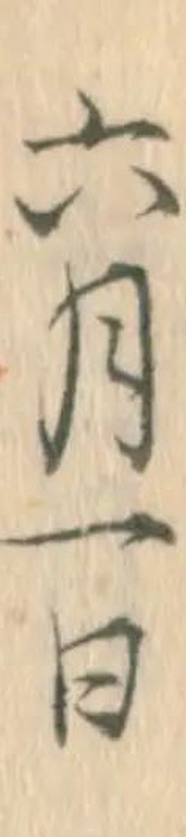六月一日
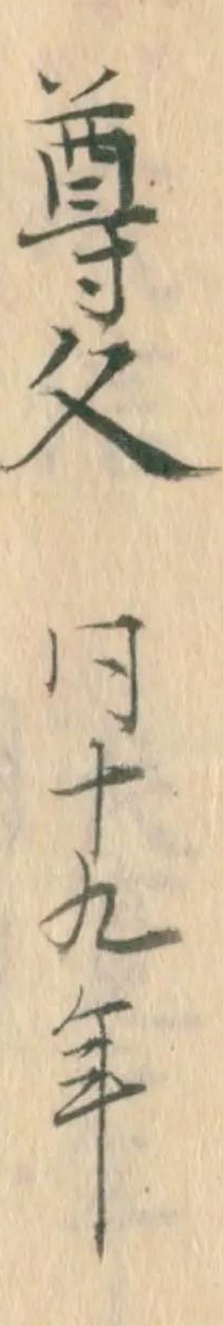尊久同十九年
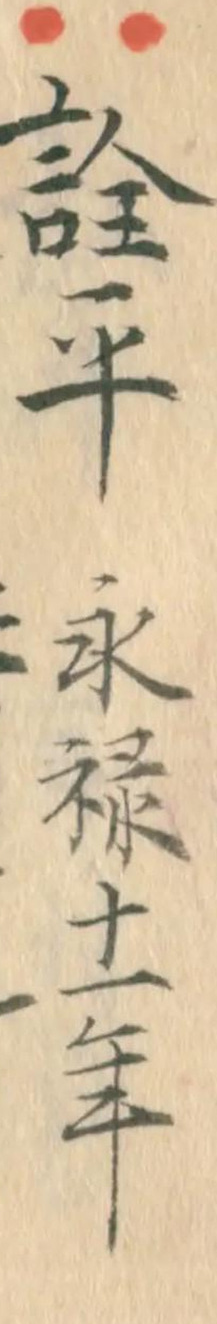∴詮平永禄十一年
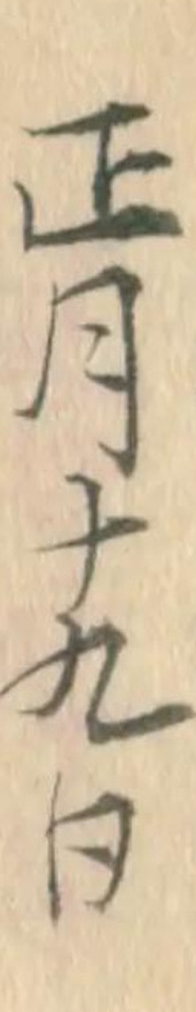正月十九日
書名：賀茂社記録. 第23冊
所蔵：国立国会図書館 National Diet Library, JAPAN
